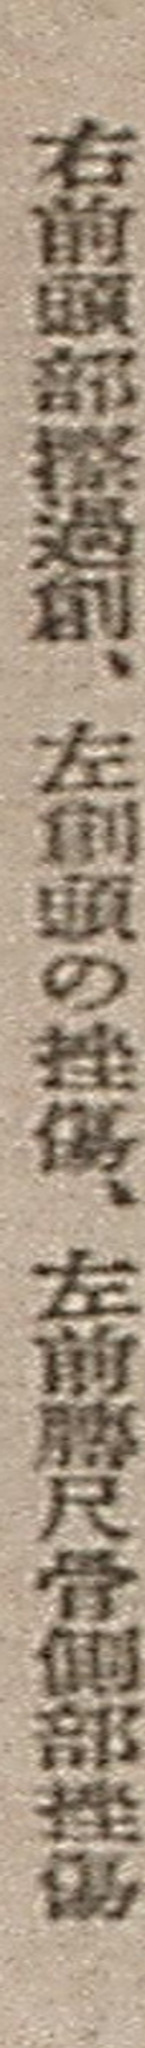右前頭部擦過創、左創頭の挫傷、左前膞尺骨側部挫傷
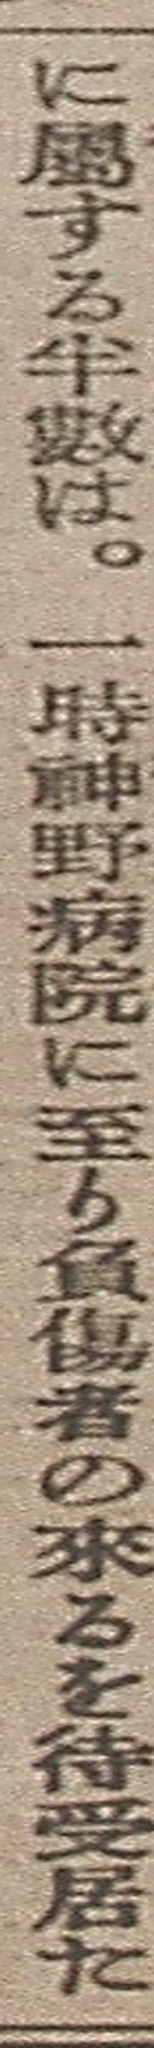に属する半数は。一時神野病院に至り負傷者の来るを待受居た
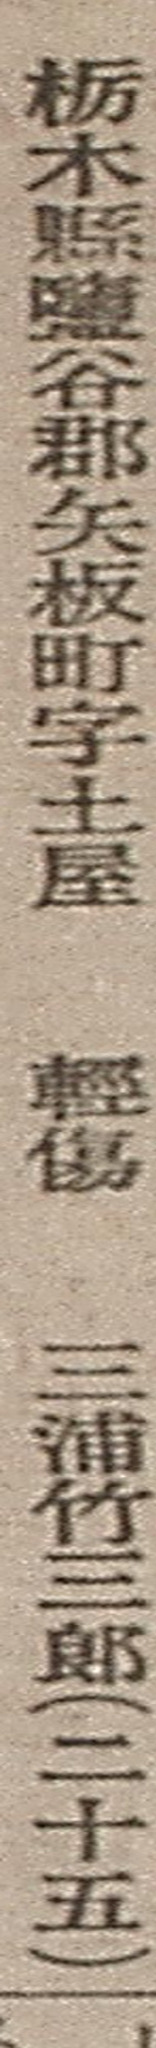栃木県塩谷郡矢板町土屋軽傷三浦竹三郎
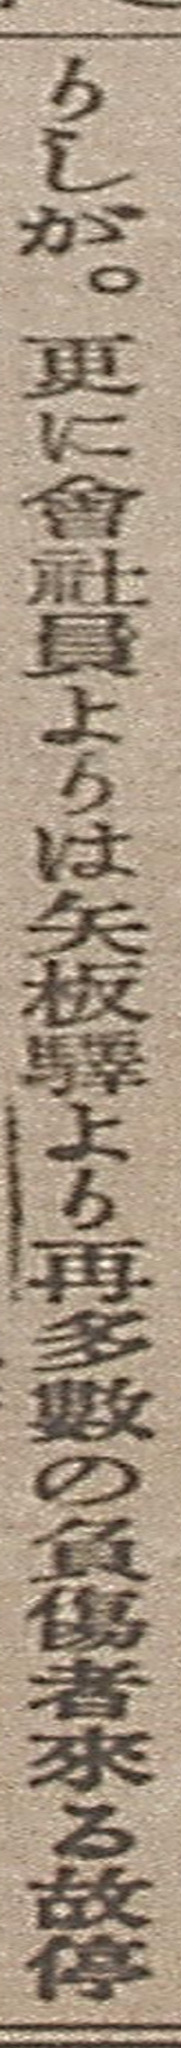りしが。更に会社員よりは矢板駅より再多数の負傷者来る故停
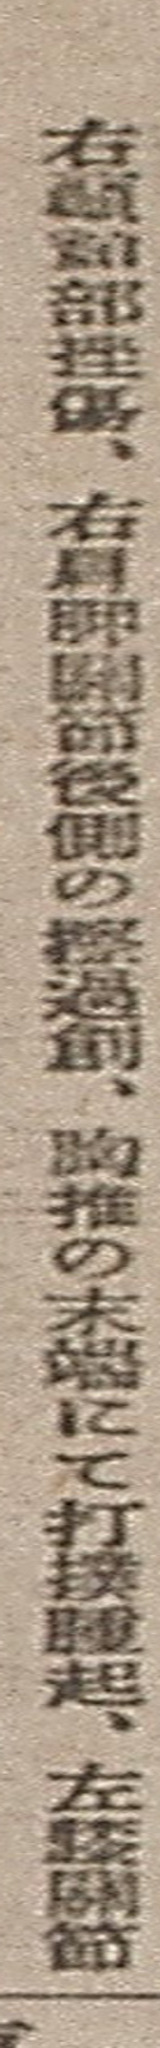右関？節？部挫傷、右肩胛関節後側の擦過創、胸推の末端にて打撲腫起、左膝関節
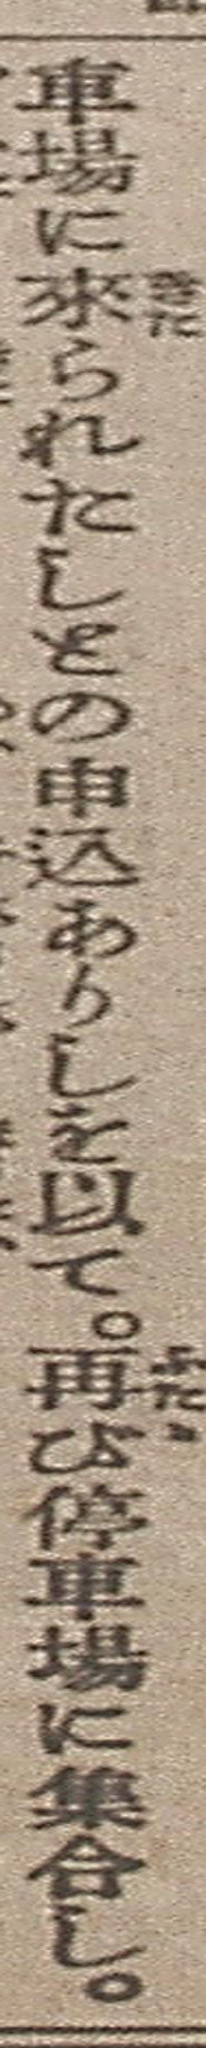車場に来られたしとの申込ありしを以て。再び停車場に集合し。
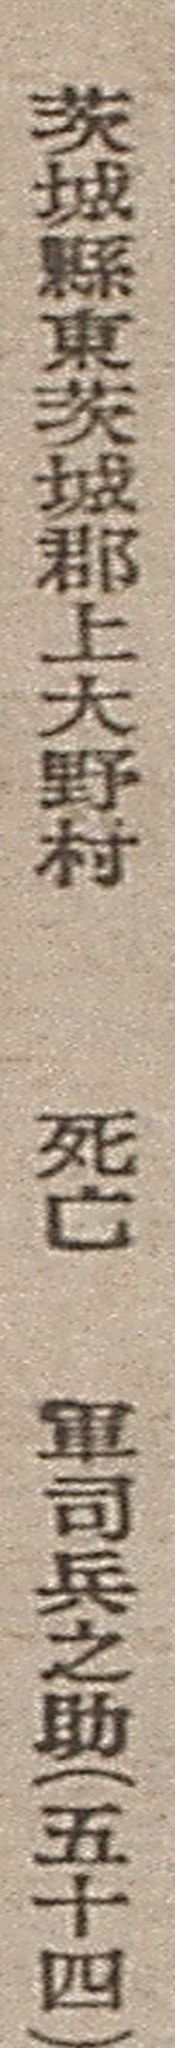茨城県東茨城郡上大野村死亡軍司兵之助
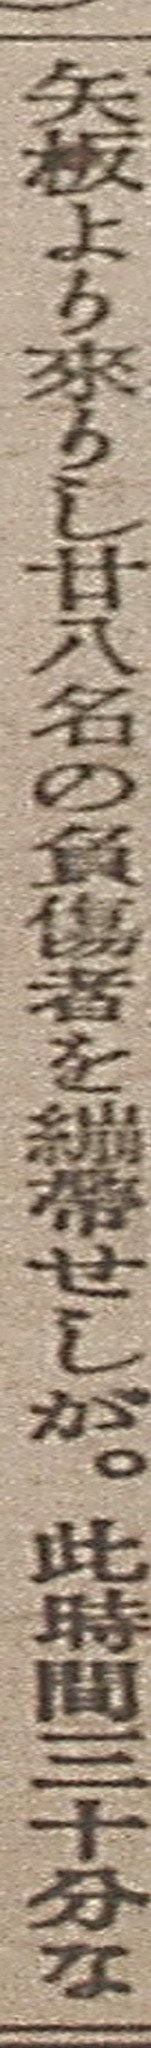矢板より来りし廿八名の負傷者を繃帯せしが。此時間三十分な
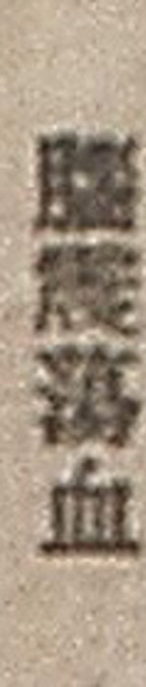脳震盪血
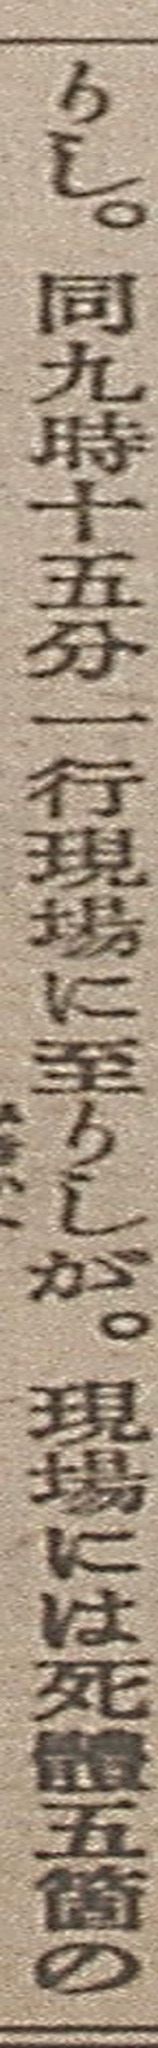りし。同九時十五分一行現場に至りしが。現場には死体五箇の
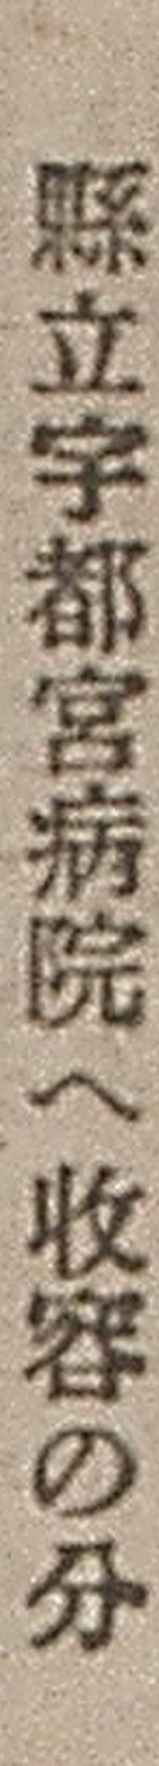県立宇都宮病院へ収容の分
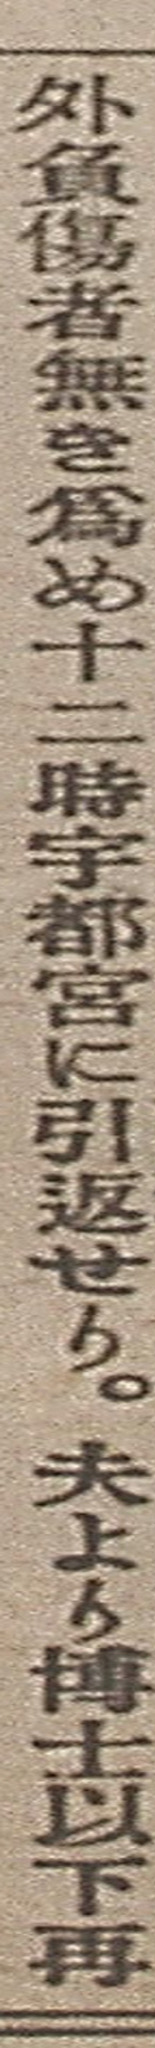外負傷者無き為め十二時宇都宮に引返せり。夫れより博士以下再
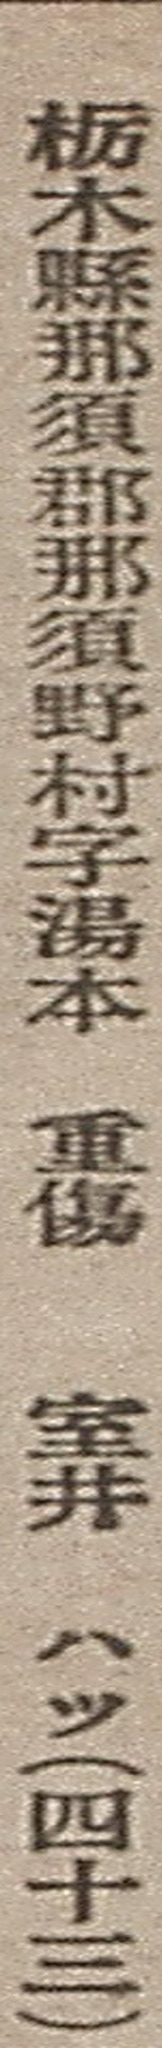栃木県那須郡那須野村字湯本重傷室井ハツ
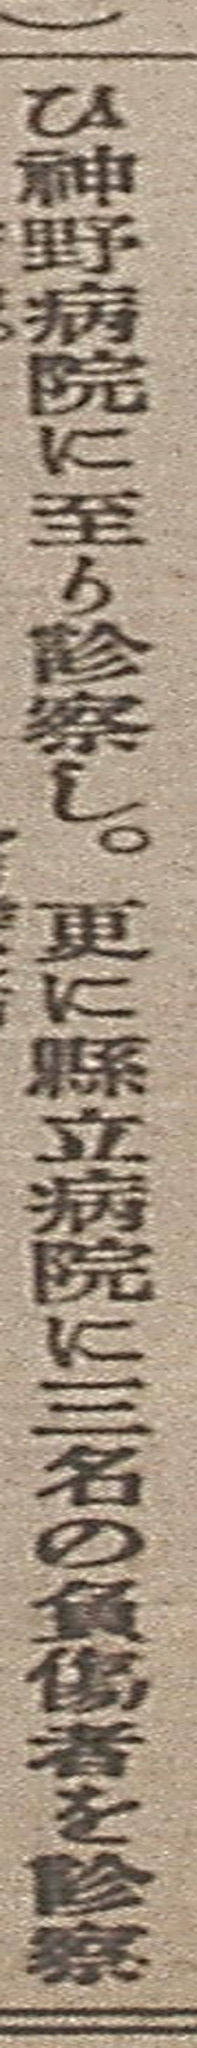ひ神野病院に至り診察し。更に県立病院に三名の負傷者を診察
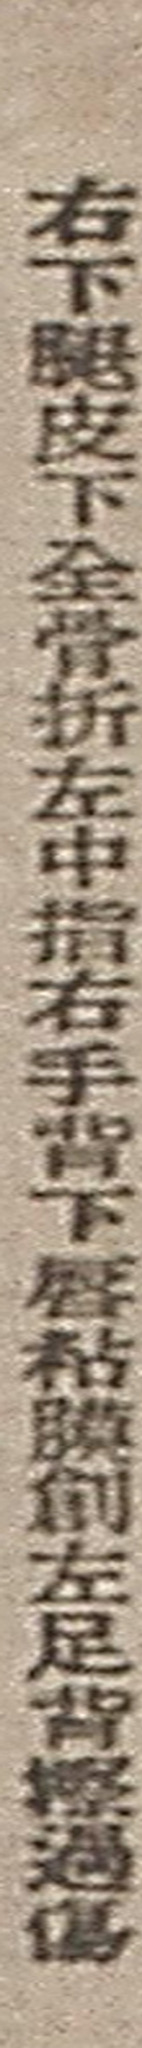右下腿皮下全骨折左中指右手背下唇粘膜創左足背擦過傷
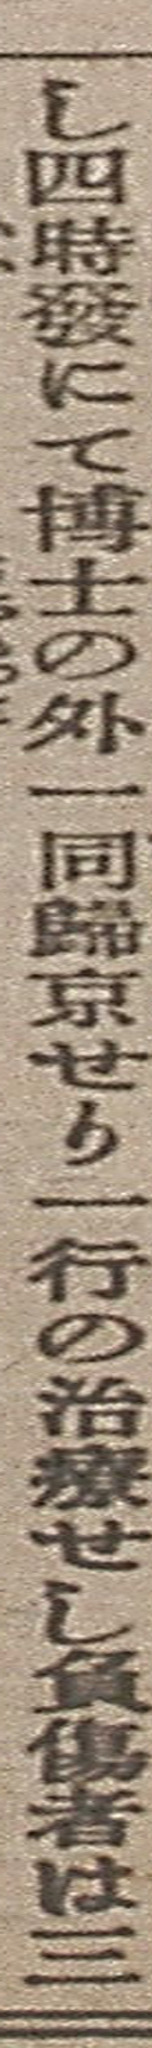し四時発にて博士の外一同帰京せり一行の治療せし負傷者は三
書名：風俗畫報臨時増刊第百九十九號　明治三十二年十月各地災害圖會（前編之續）
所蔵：東京大学地震研究所図書室 Earthquake Research Institute Library, The University of Tokyo, JAPAN
